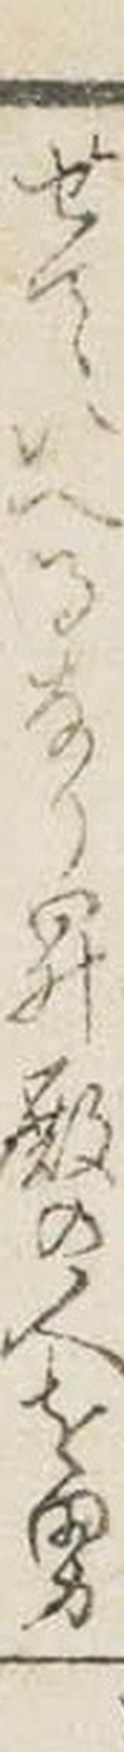せていへるなり昇殿の人を男
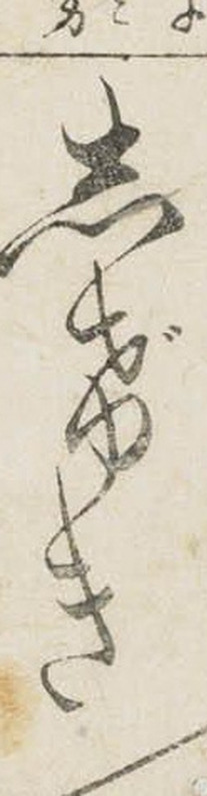しげき
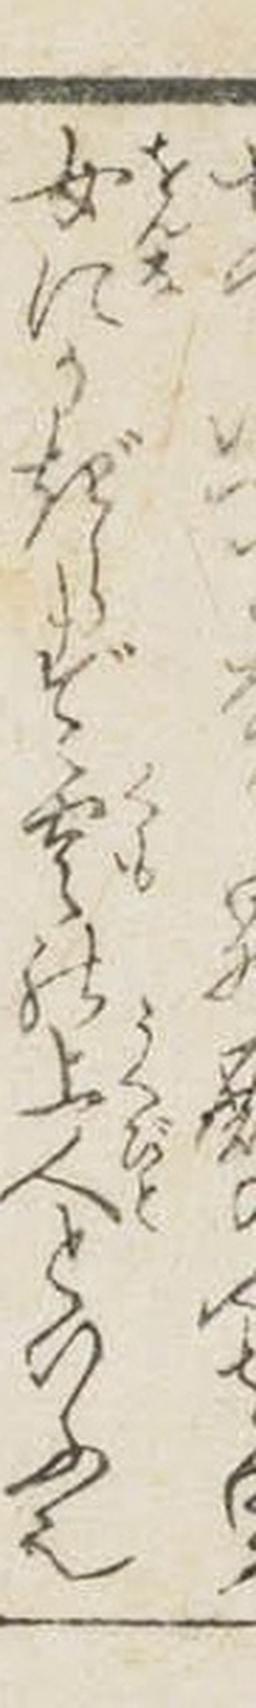女にかぎらず雲の上人といふ也
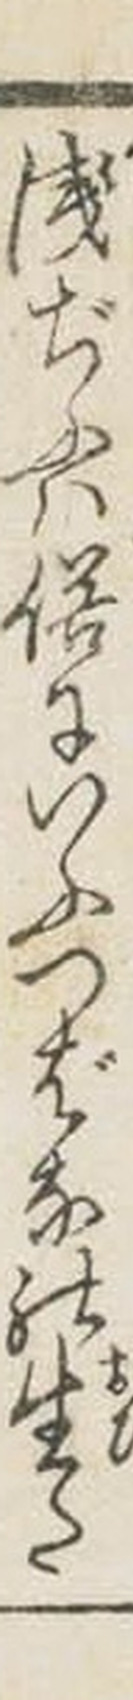浅ぢふは俗にいふつばなの生た
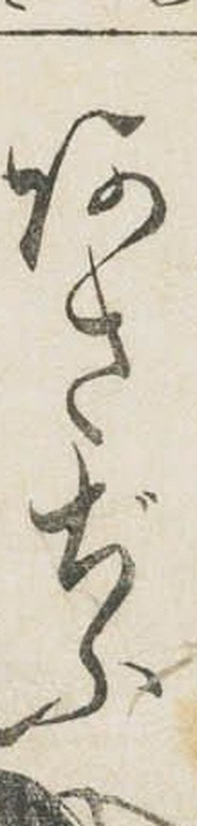あさぢふ
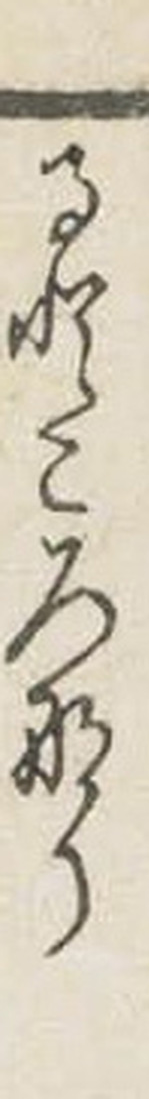るところなり
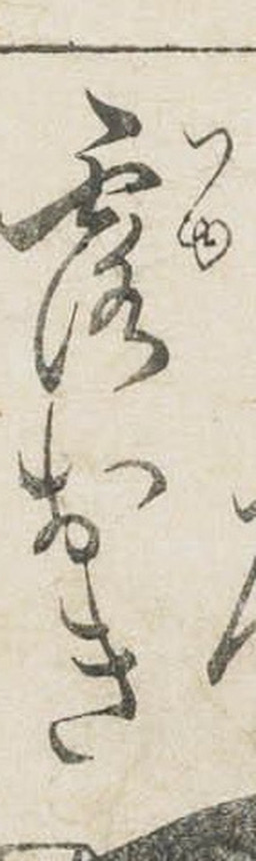露おき
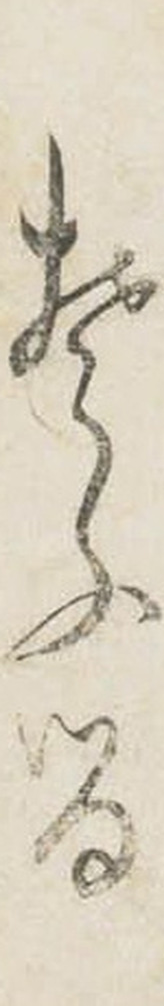そふる
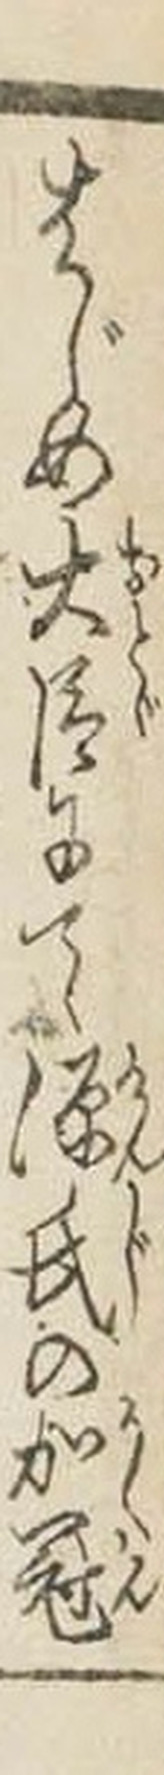はじめ大臣にて源氏の加冠
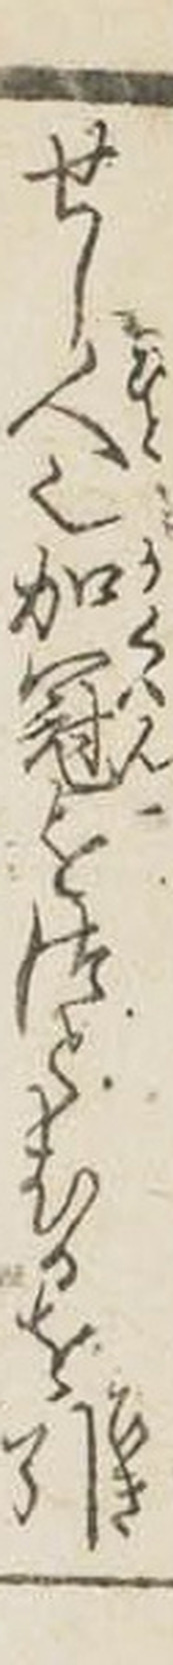せし人也加冠をつとむるを引
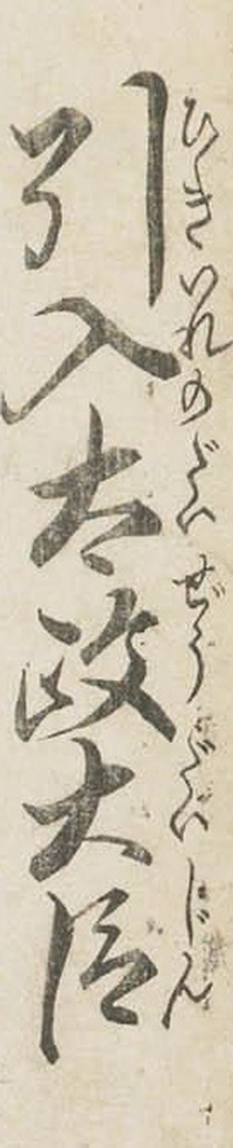引入太政大臣
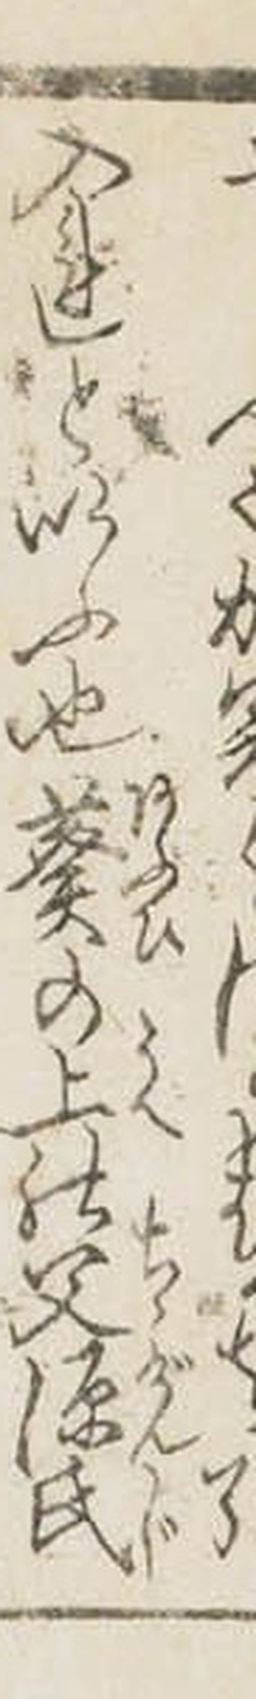入れといふ也葵の上の父源氏
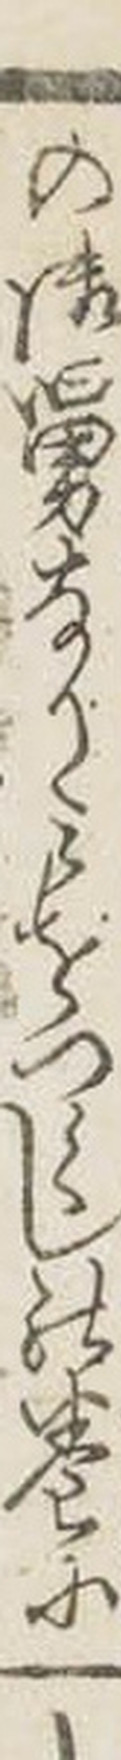の御舅なりみをつくしの巻に
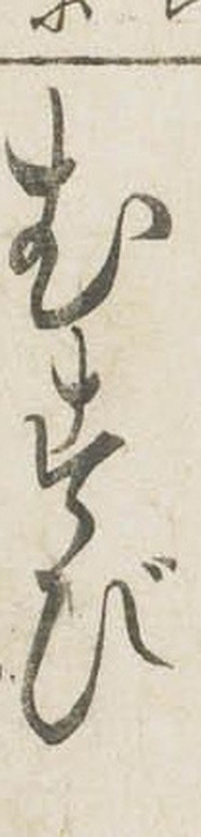むすび
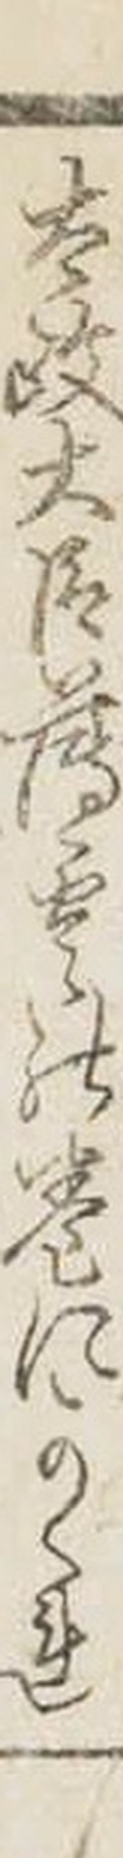太政大臣薄雲の巻にかくれ
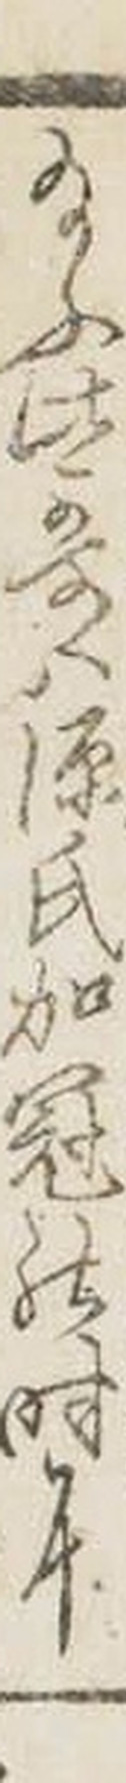給ふ此哥は源氏加冠の時に
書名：源氏百人一首
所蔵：東京学芸大学教育コンテンツアーカイブ
